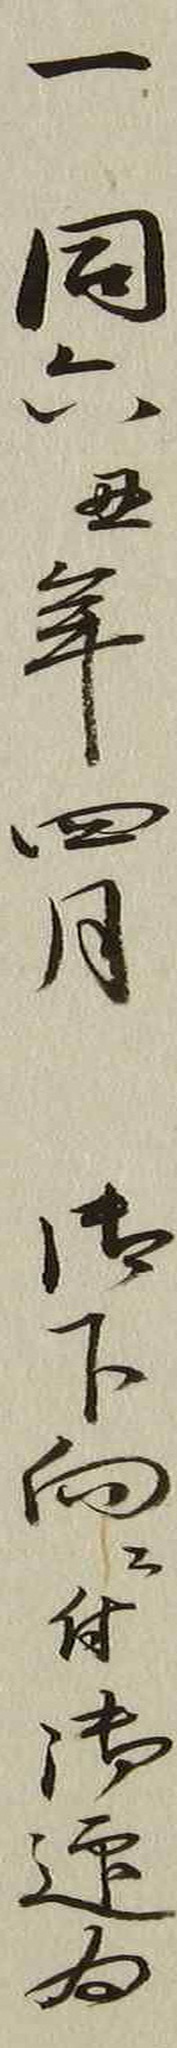一同六丑年四月御下向ニ付御迎為
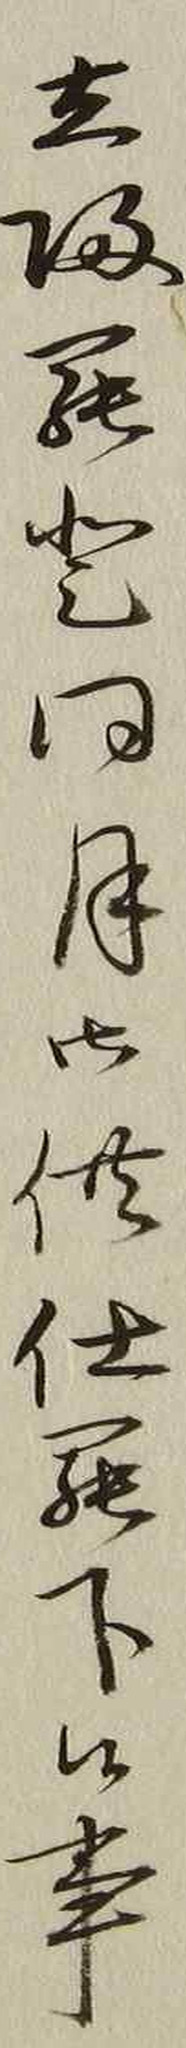立帰罷登同月御供仕罷下候事
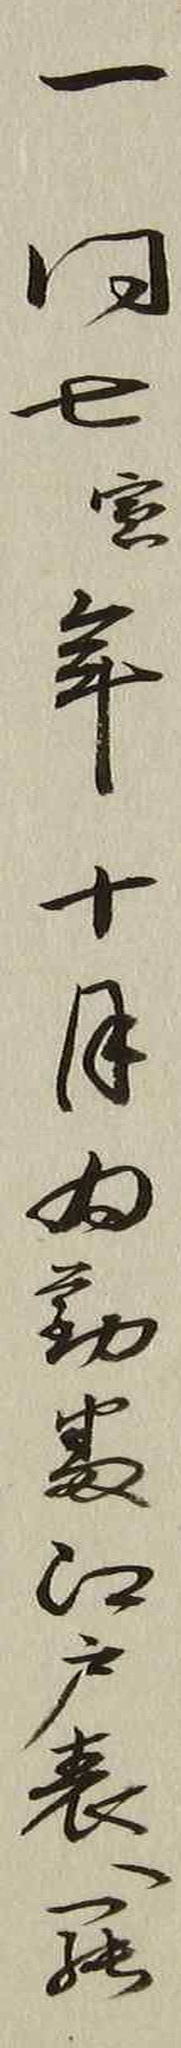一同七寅年十月為勤番江戸表へ罷
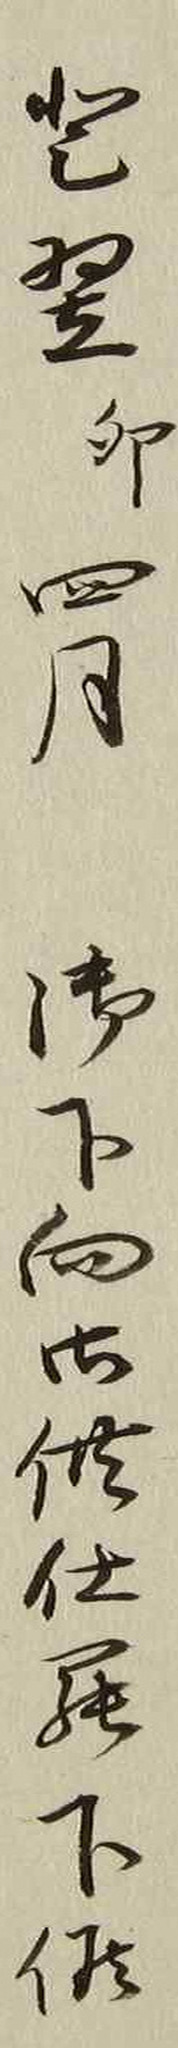登翌卯四月御下向御供仕罷下候
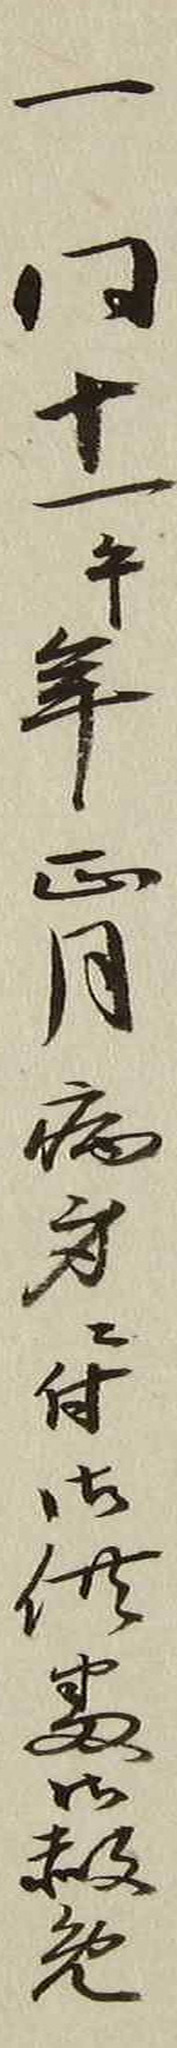一同十一午年正月病身ニ付御供番御赦免
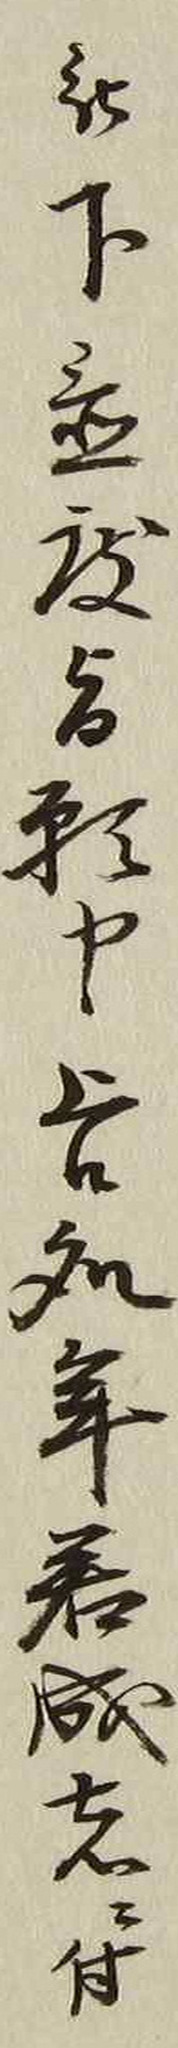被下置度旨願申上候処年若成者ニ付
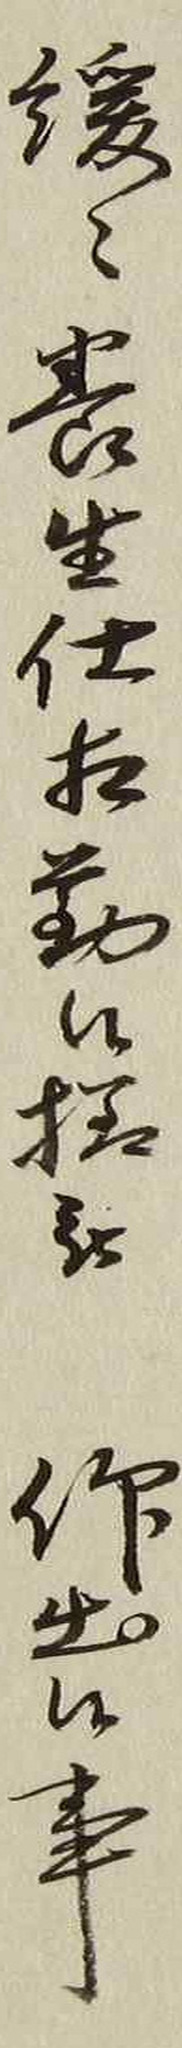緩々養生仕相勤候様被仰出候事
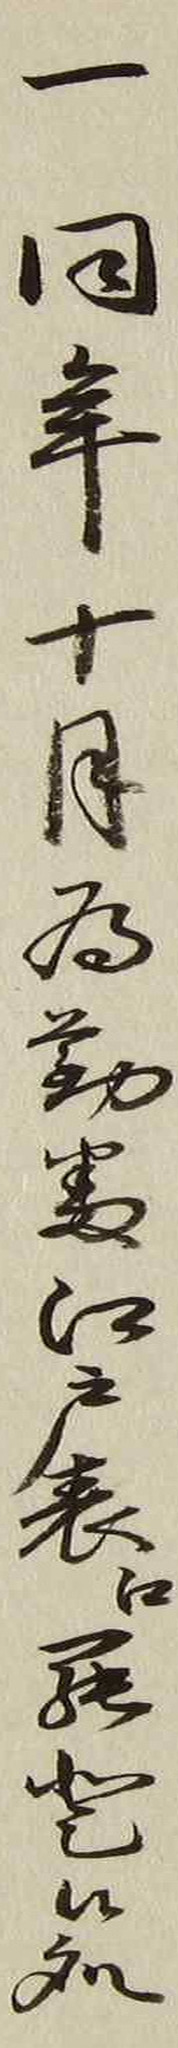一同年十月為勤番江戸表江罷登候処
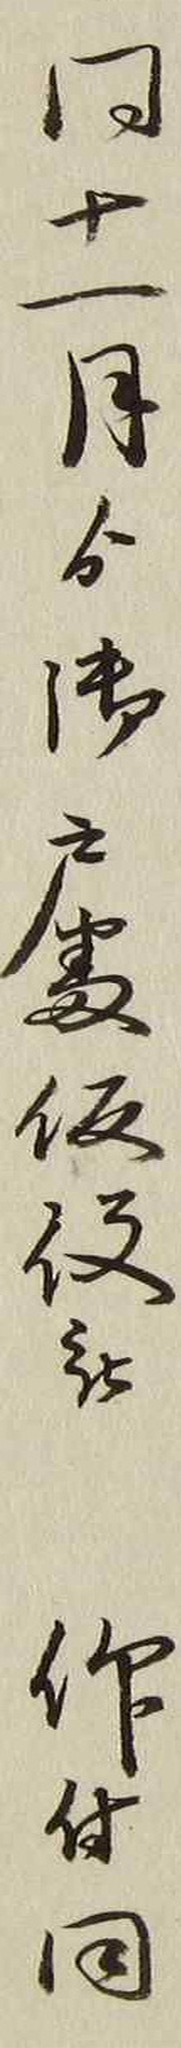同十一月ゟ御戸番仮役被仰付同
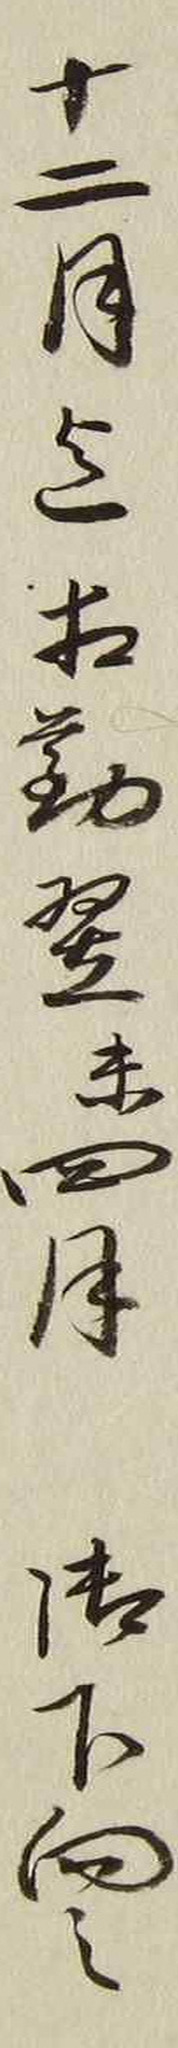十二月迄相勤翌未四月御下向之
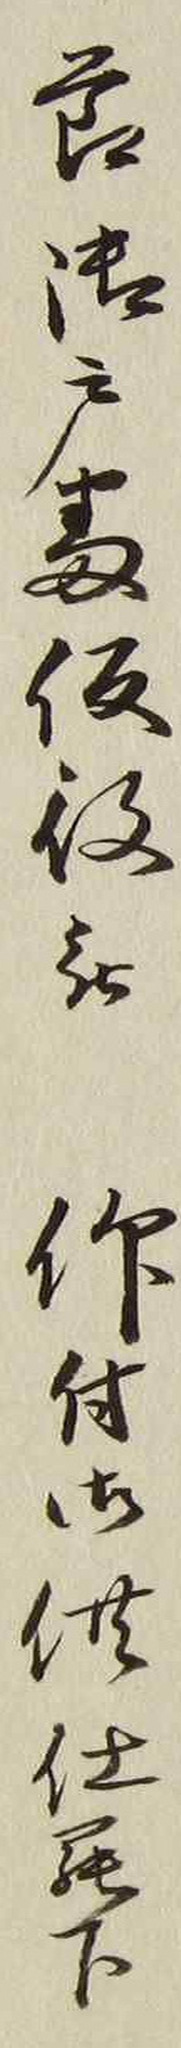節御戸番仮役被仰付御供仕罷下

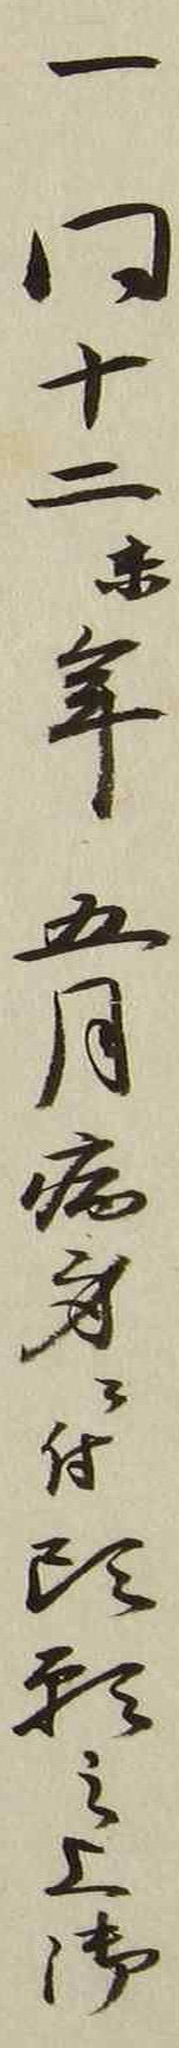一同十二未年五月病身ニ付頭願之上御
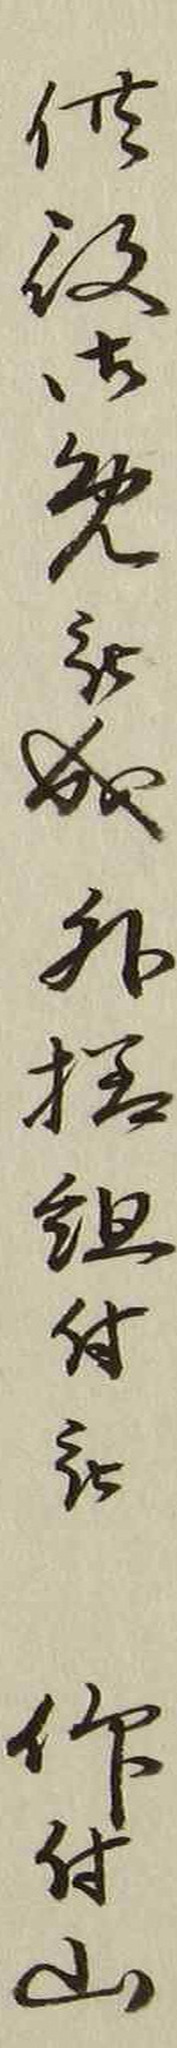供役御免被成外様組付被仰付山
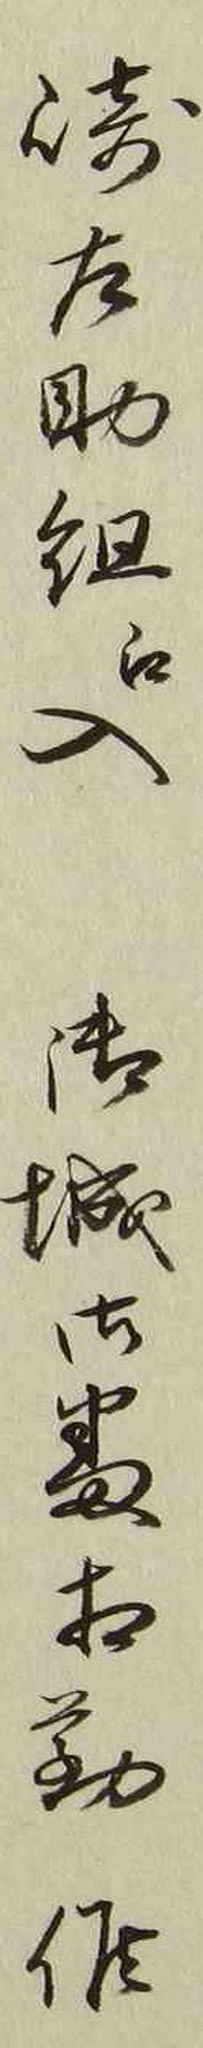崎左助組江入御城御番相勤候
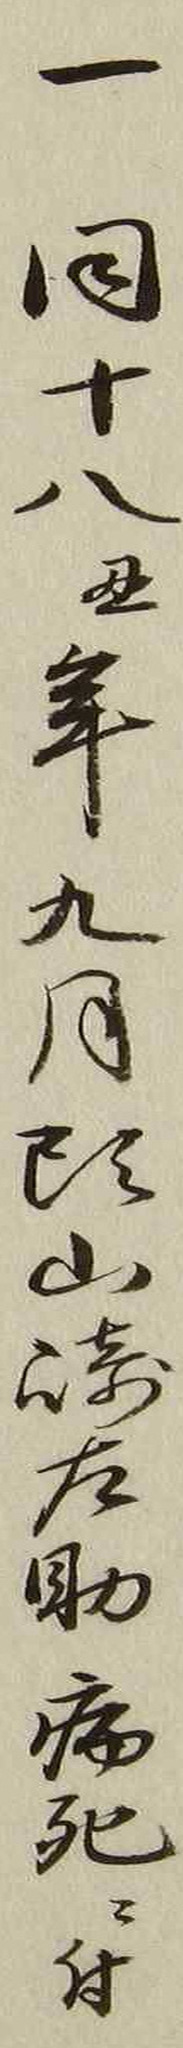一同十八丑年九月頭山崎左助病死ニ付
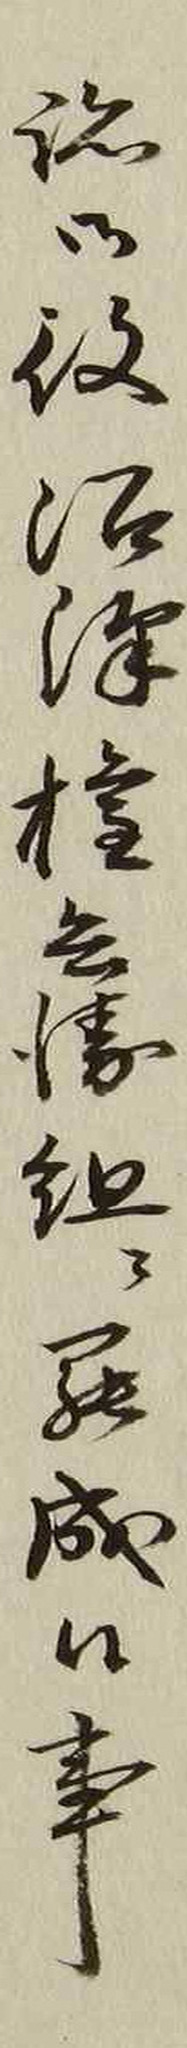跡御役沼沢権兵衛組ニ罷成候事
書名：諸士系譜　巻之149　そ之部2
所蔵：会津若松市立会津図書館
